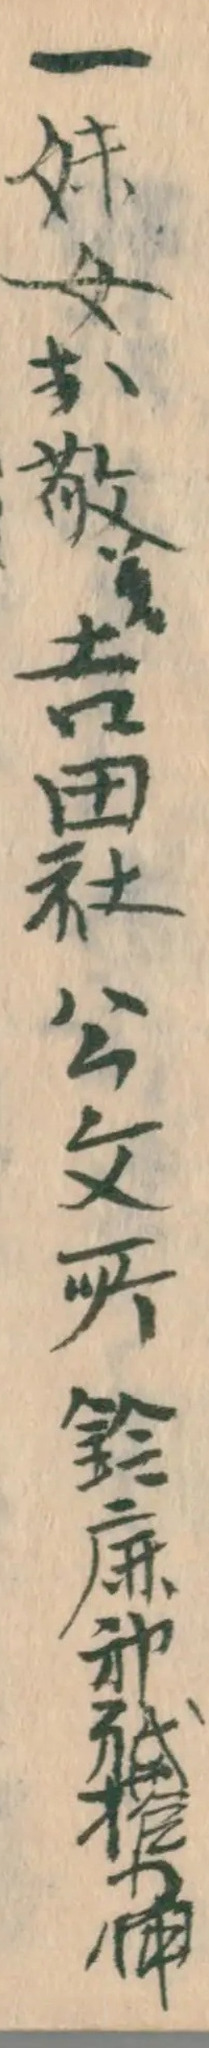一妹女お敬義吉田社公文所鈴鹿神祇権少輔
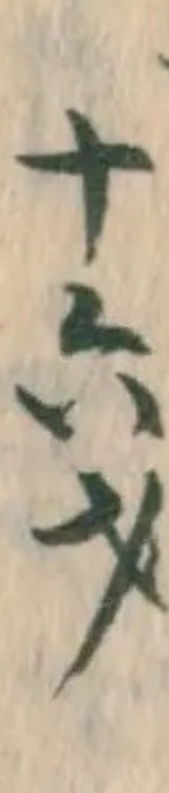十六才
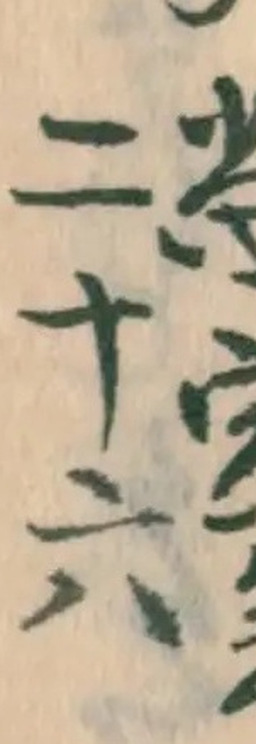二十六
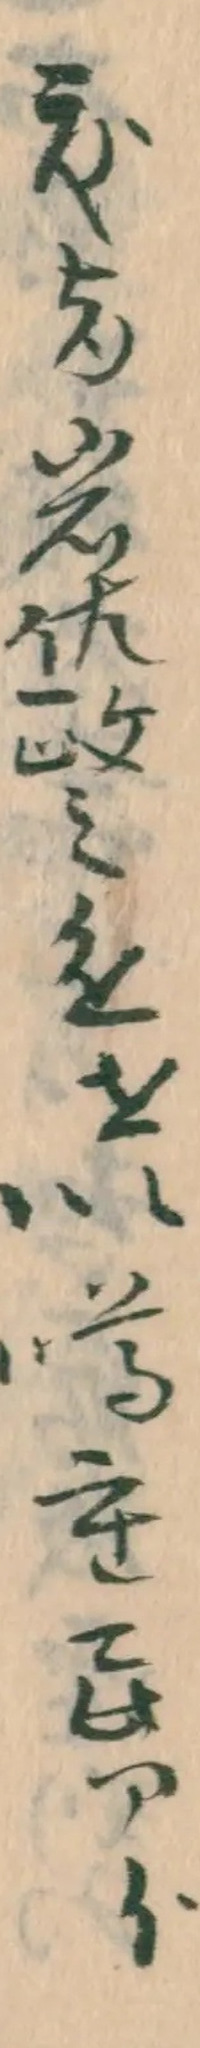度旨岩佐政之進を以噂民部ゟ
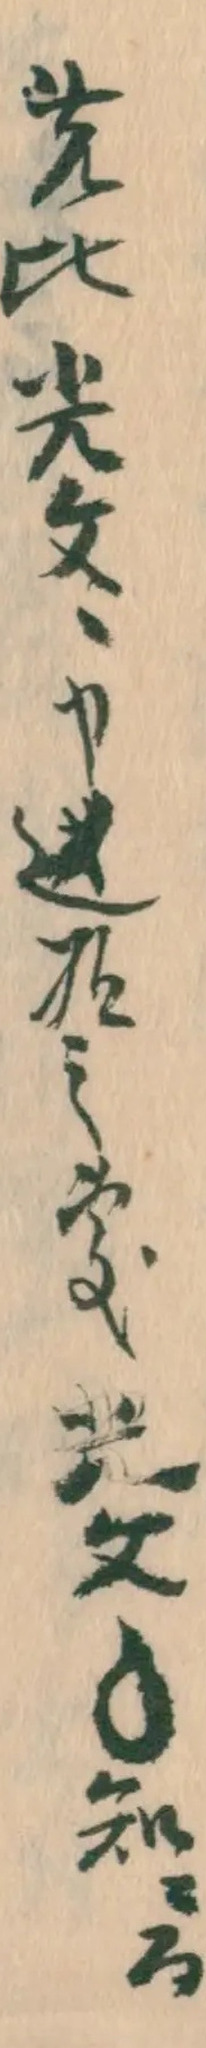先頃光文申込有之処光文承知ニ而
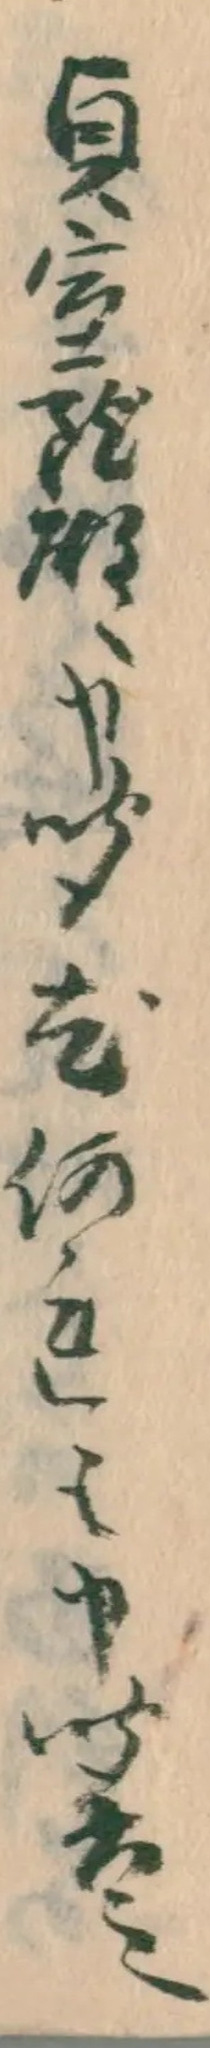貞室院殿へ申聞尤何れも申聞有之
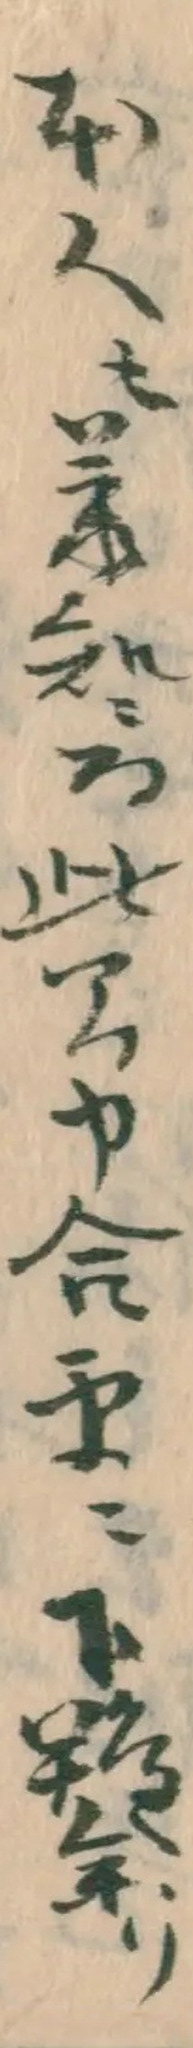本人も承知ニ而此間申合更ニ下鴨へ参り
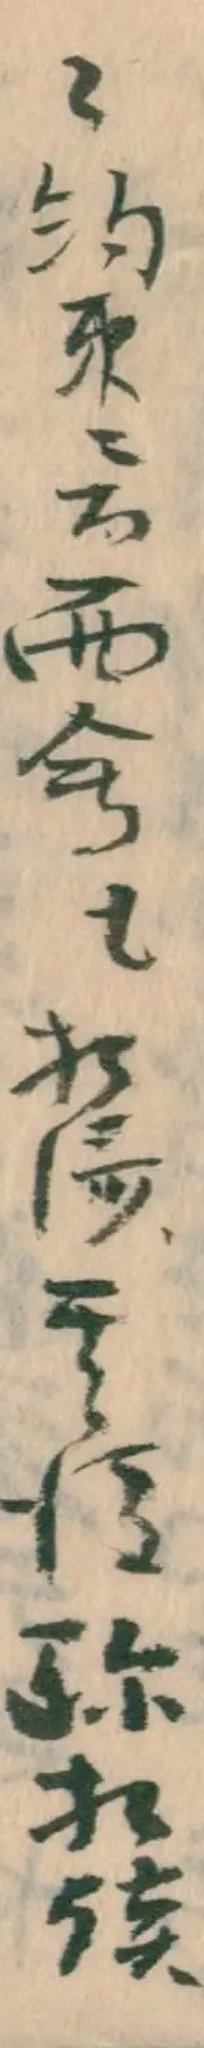候約束ニ而面会も相済其後弥相談
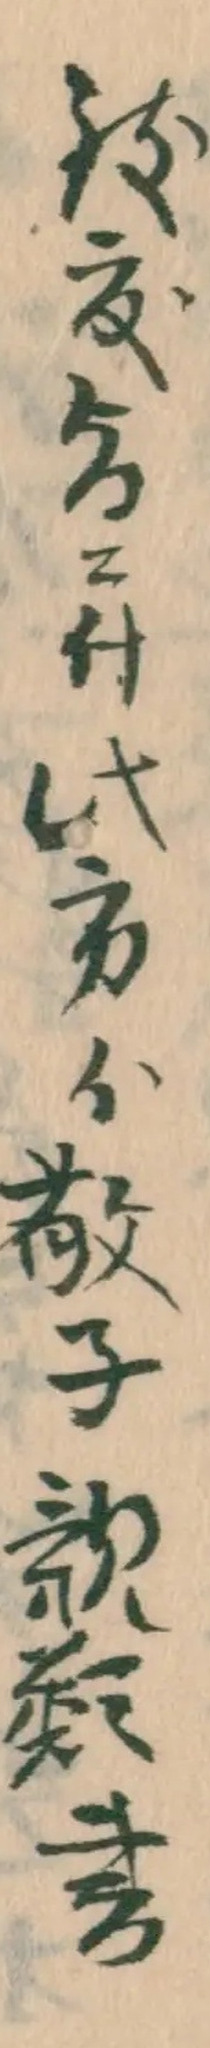致度旨ニ付此方ゟ敬子親類書
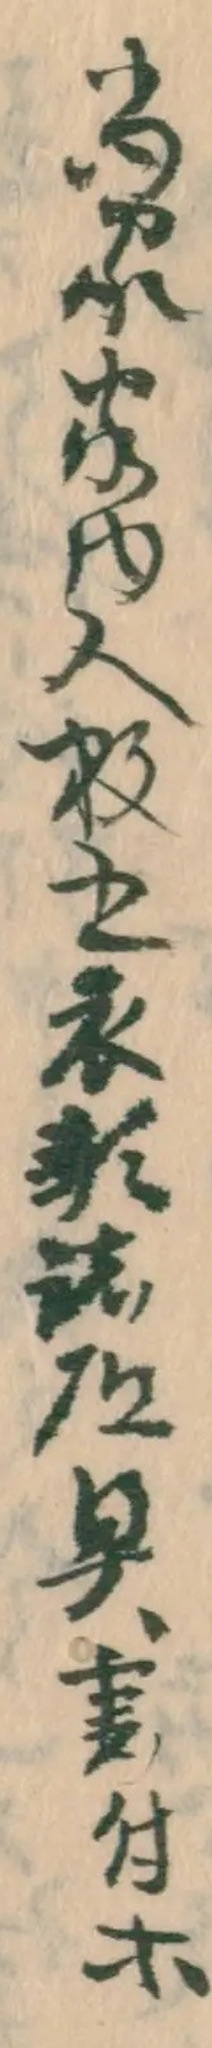当家家内人数書衣類諸道具書付等
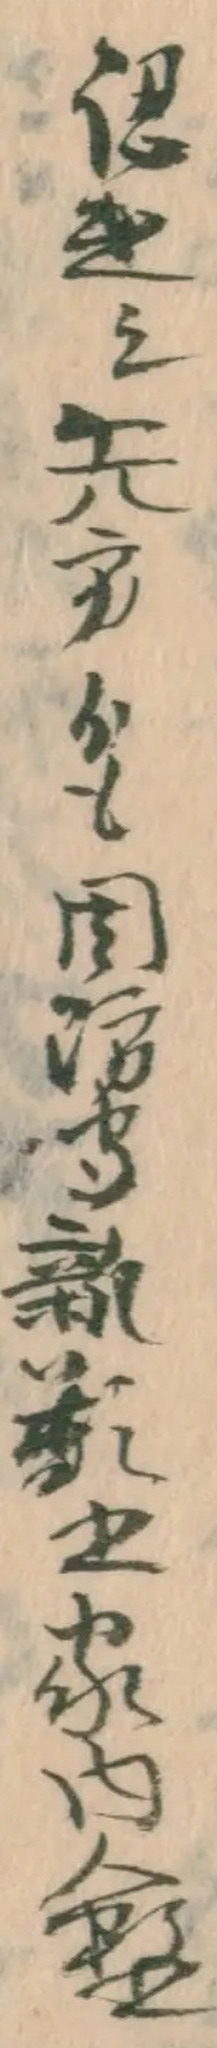認遣シ先方ゟも周防守親類書家内人数書
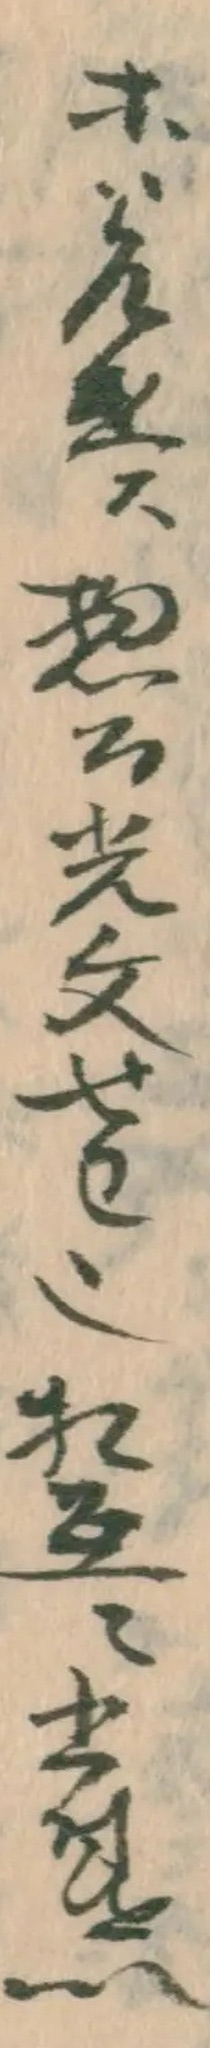等差遣ス惣而光文せわ也相互ニ書付を以
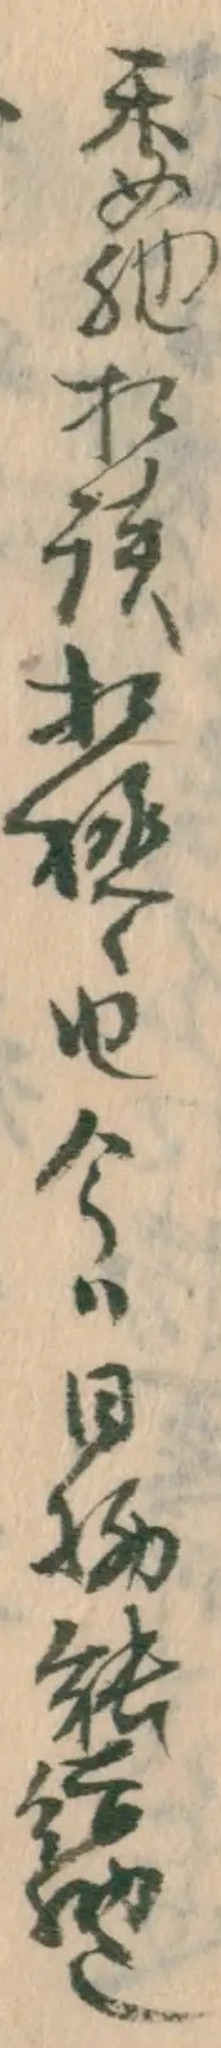委細相談相極候由今日日柄能結納也
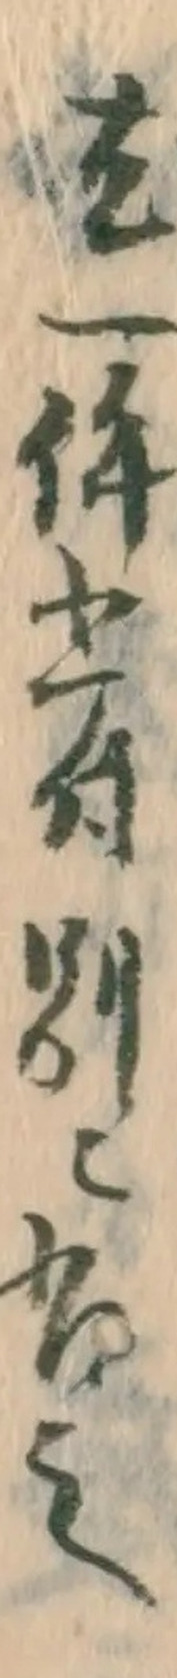尤一件書付別ニ有之
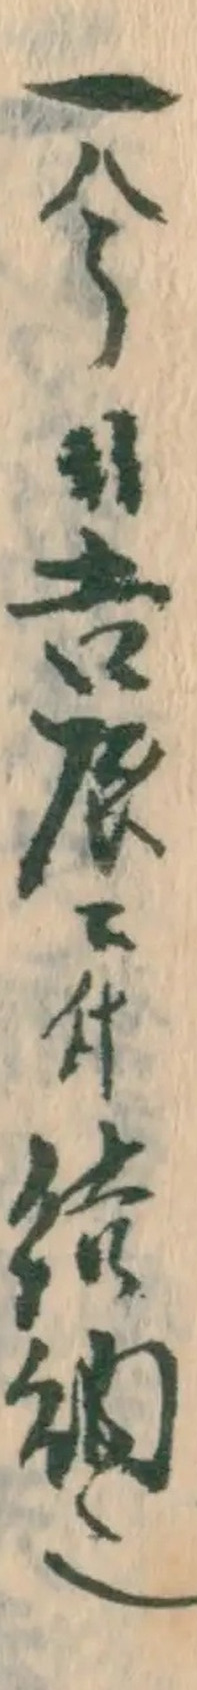一今日吉辰ニ付結納也
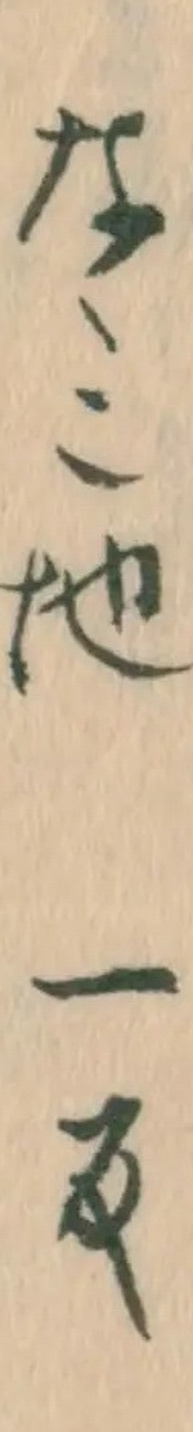なゝこ地一反
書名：禁裏御所御用日記. [131]
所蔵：国立国会図書館 National Diet Library, JAPAN
